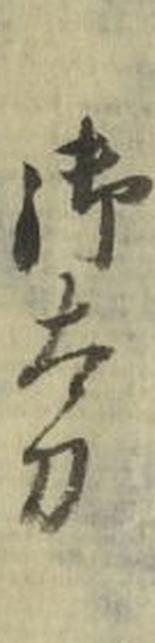御太刀
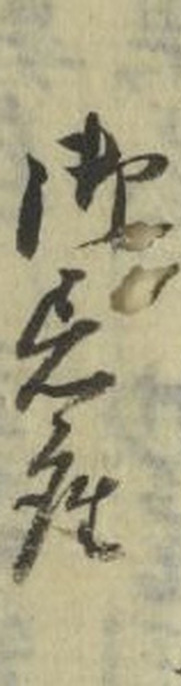御着座
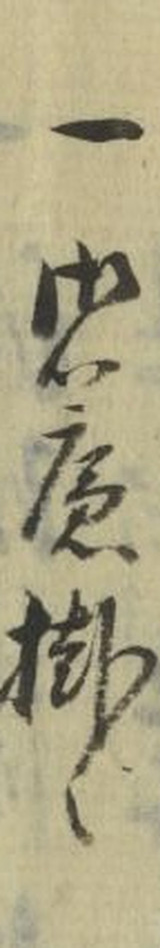一御簾掛之
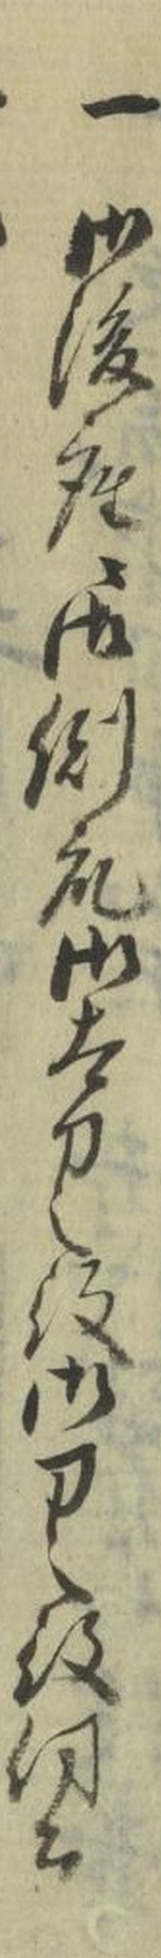一御後座に御側衆御太刀之役御刀之役伺公
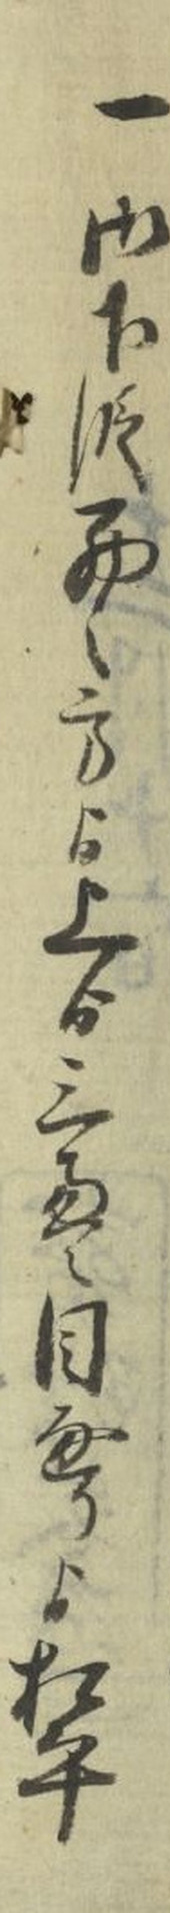一御下段西之方ゟ上ゟ三畳目通りゟ松平
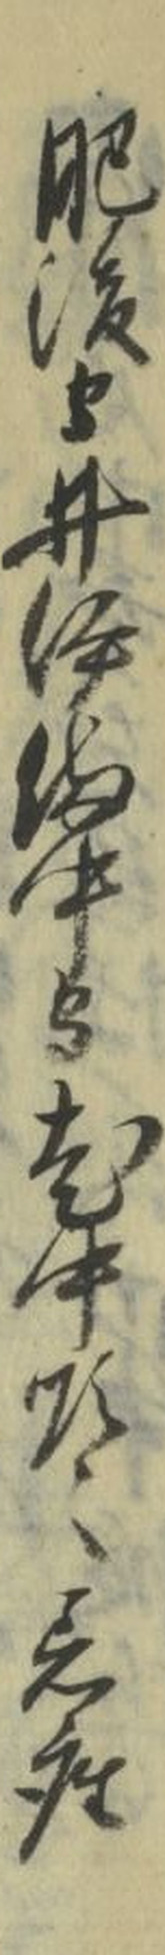肥後守井伊備中守老中順々着座
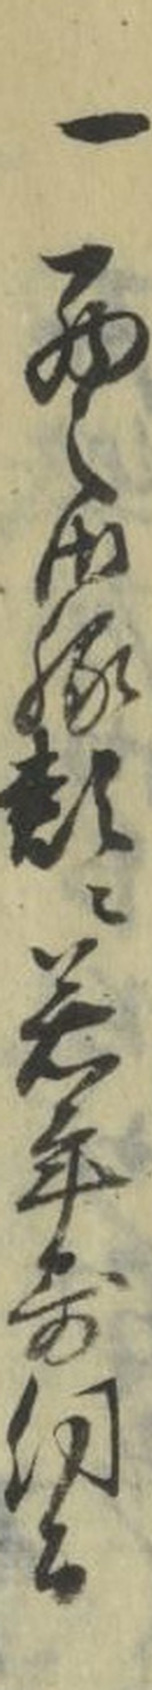一西之御縁頬に若年寄伺公
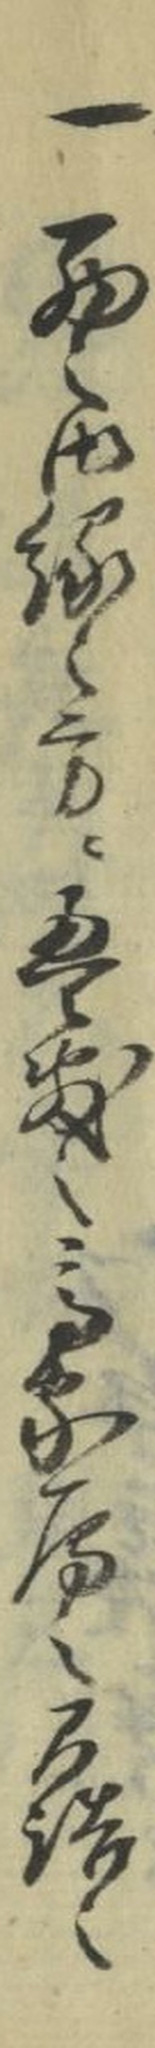一西之御縁之方に畳敷之高家鴈之間詰之
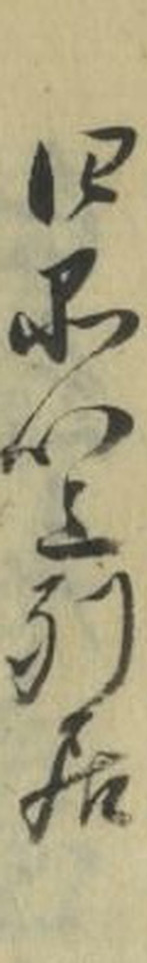四品以上列居
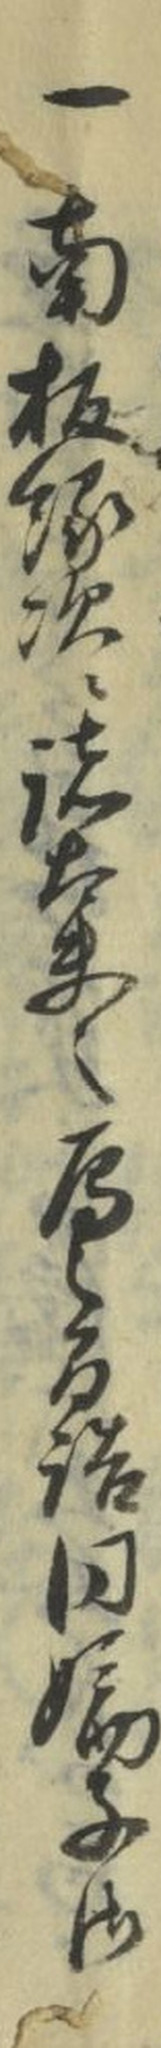一南板縁次に諸太夫之雁之間詰同嫡子御
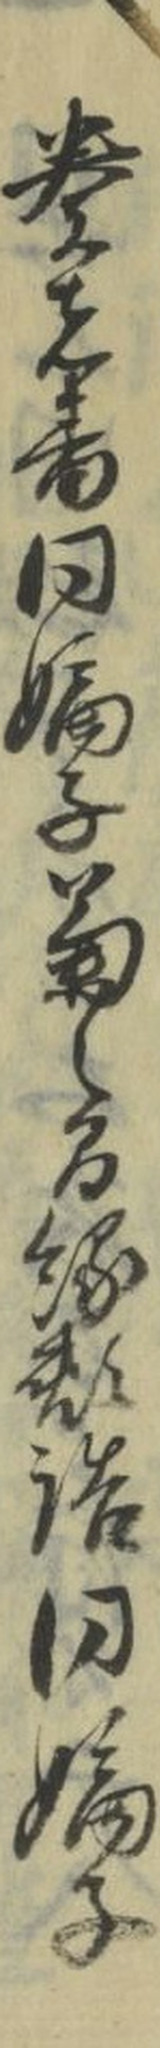奏者番同嫡子菊之間縁頬詰同嫡子
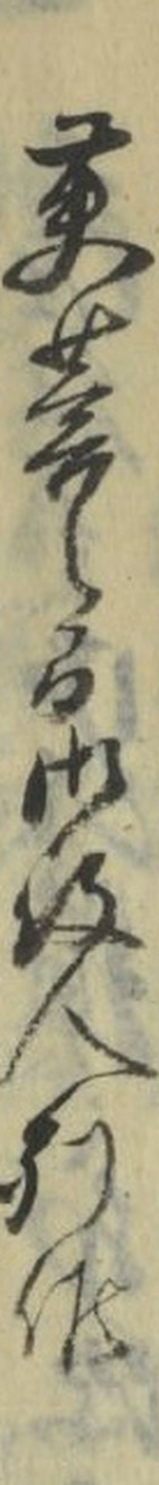芙蓉之間御役人列候
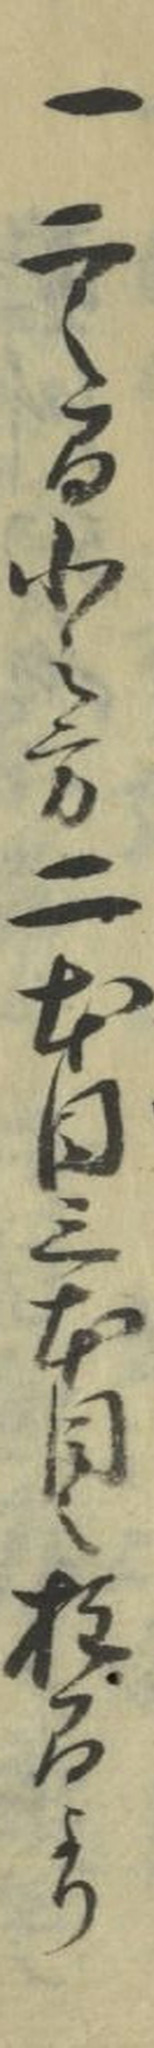一二之間北之方二本目三本目之柱間より
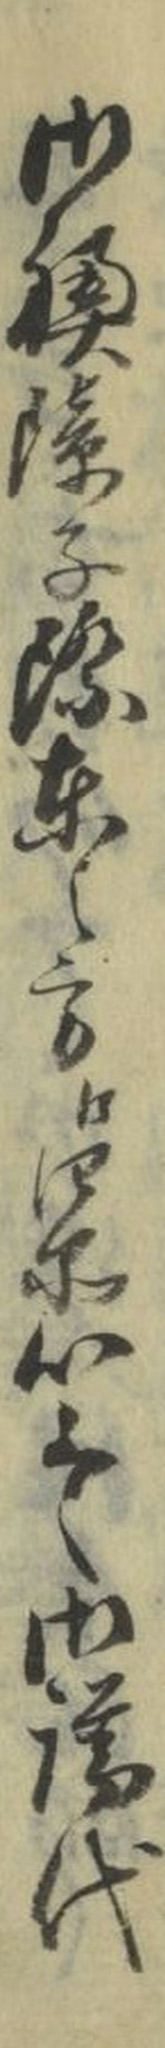御襖障子際東之方え四品以上之御譜代
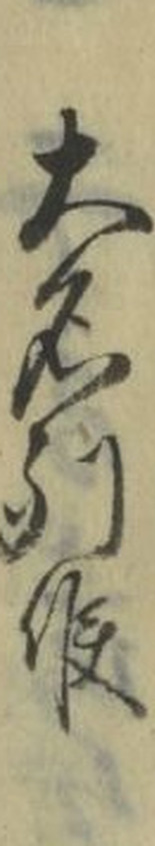大名列候

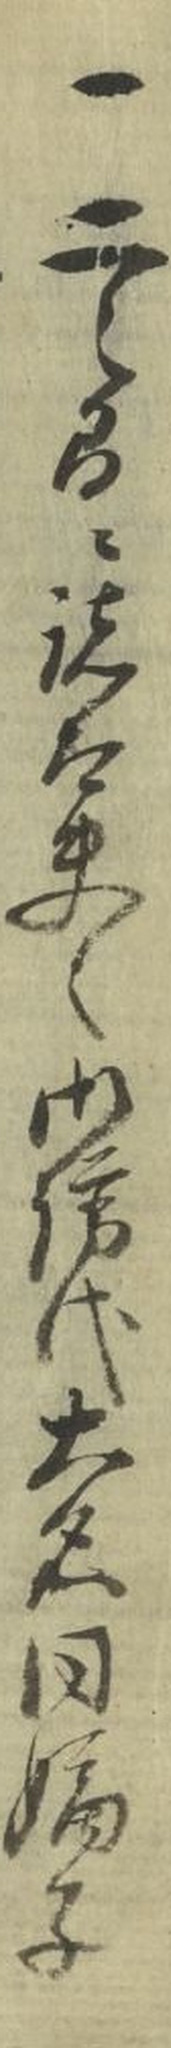一二之間に諸太夫之御譜代大名同嫡子
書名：戊辰琉球人来朝之式 全
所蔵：University of the Ryukyus Library
